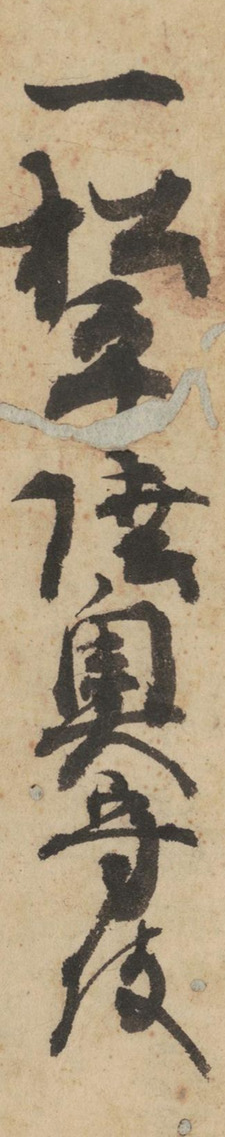一松平陸奥守殿
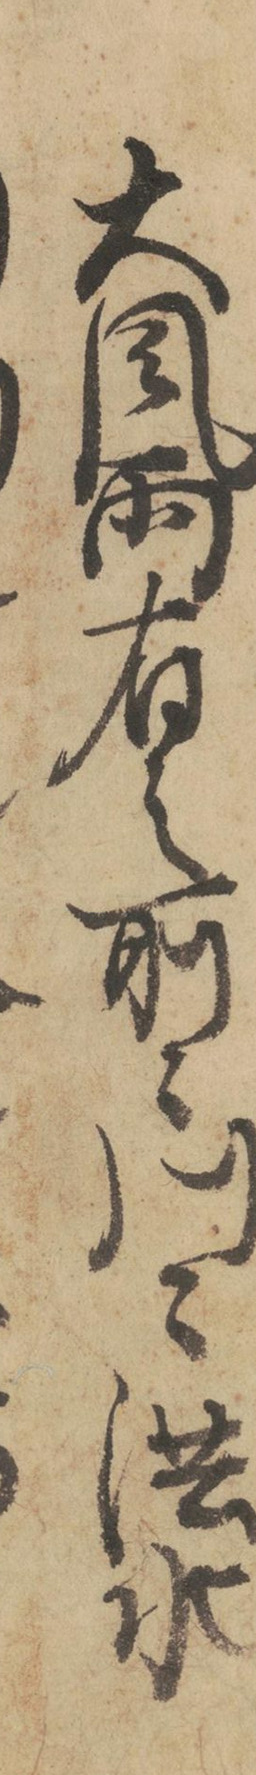大風雨有之所々川々洪水
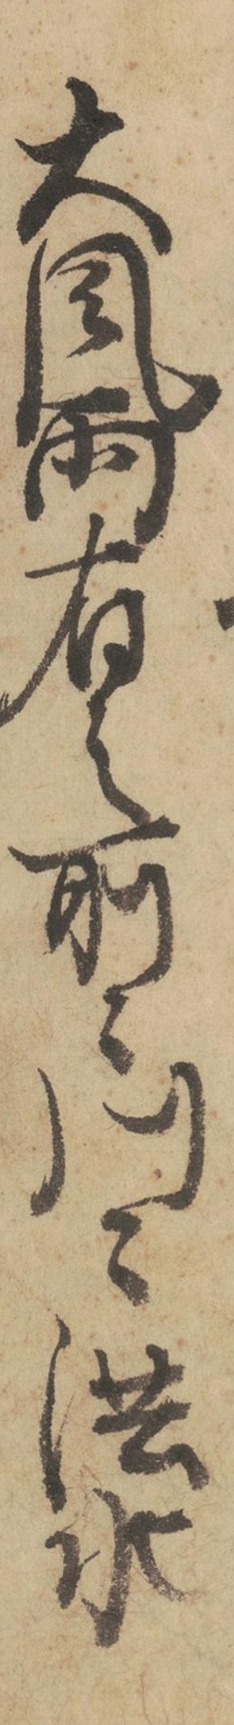大風雨有之所々川々洪水
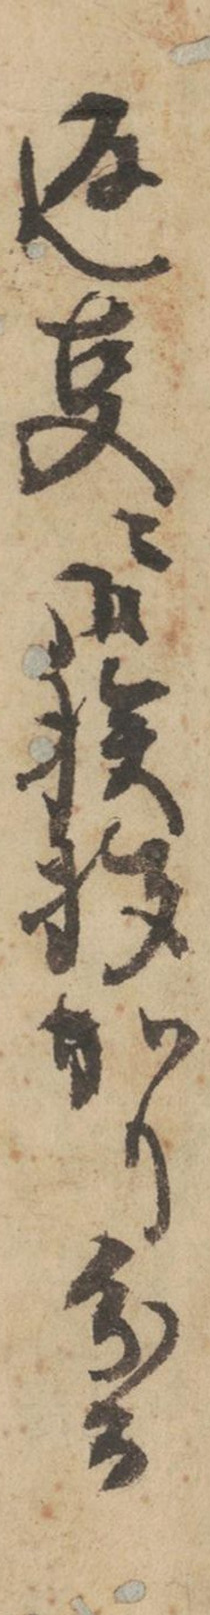返事二御挨拶加り分而
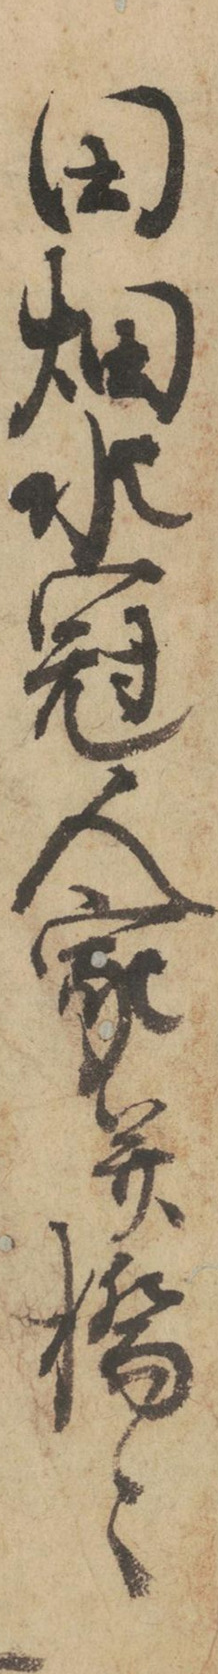田畑水冠人家并橋々
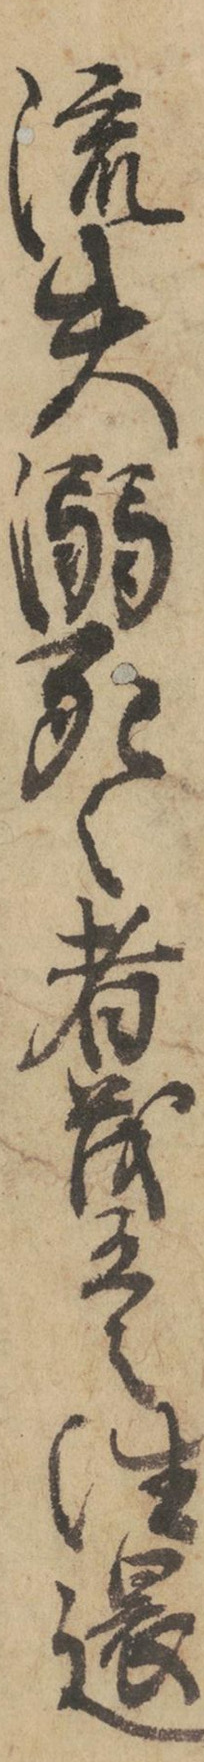流失溺死之者も有之往還
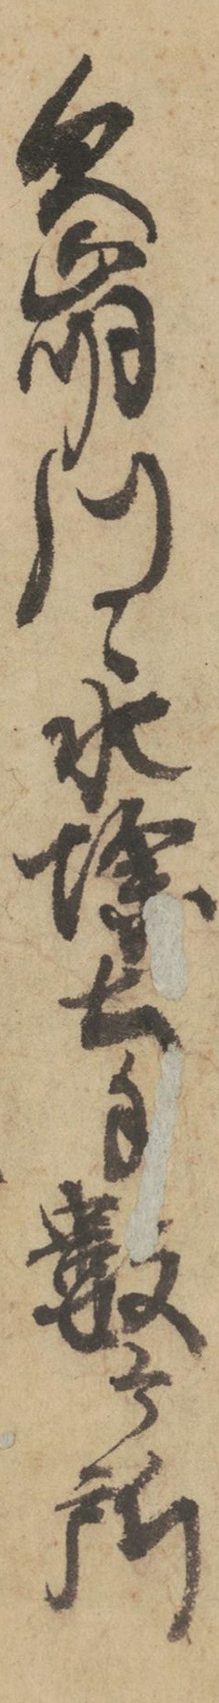欠崩川々水堰土手数ヶ所
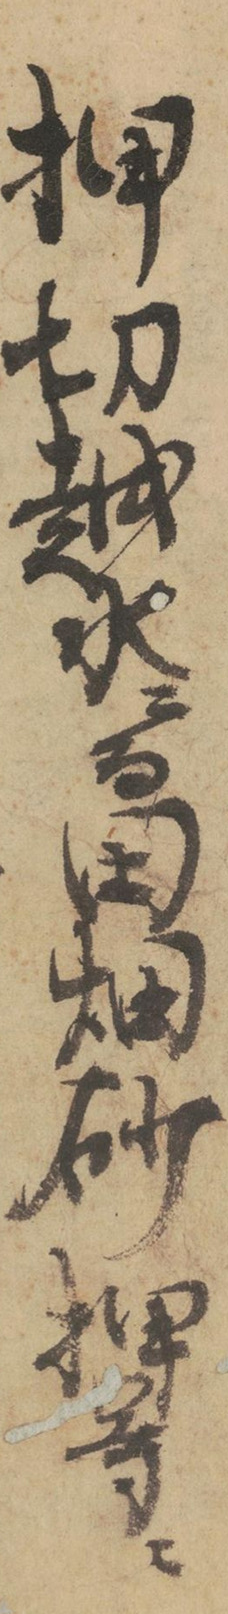押切越水二而田畑砂押等二
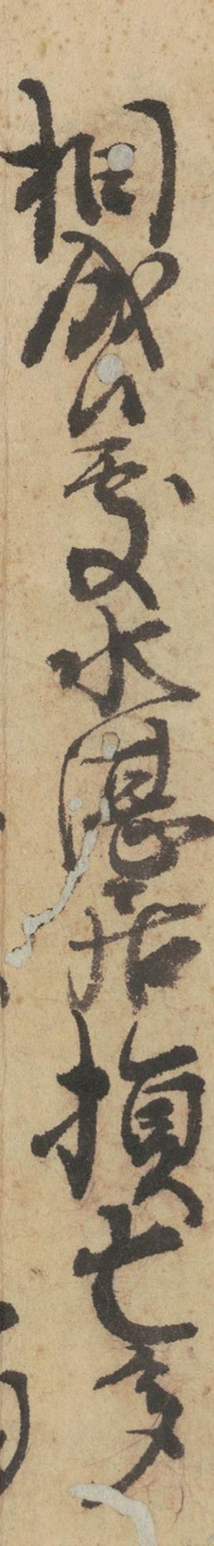相成候処水湛居損亡多
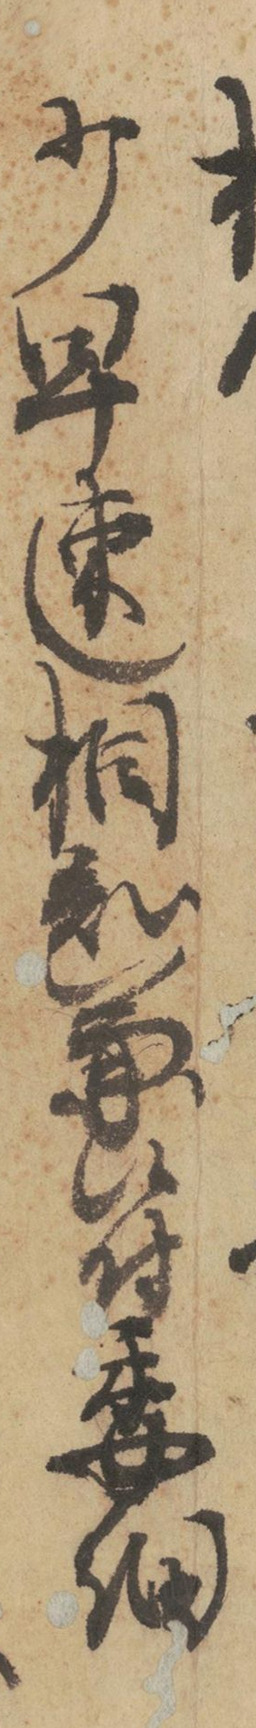少早速相知兼候付委細
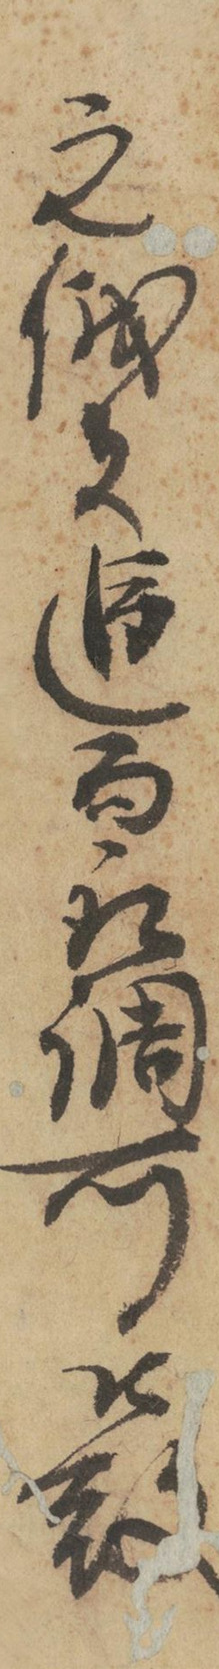之儀は追而取調可被致
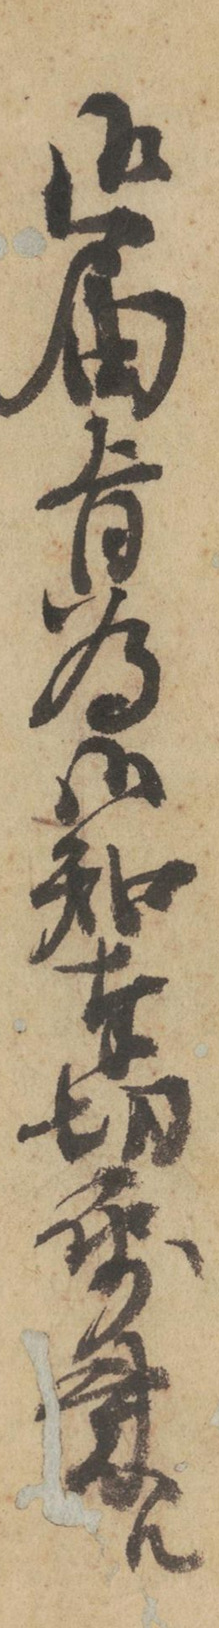御届旨為御知奉切紙来ㇽ
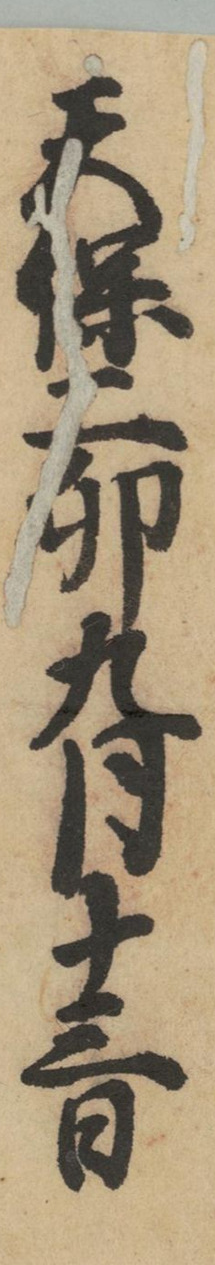天保二卯九月十三日
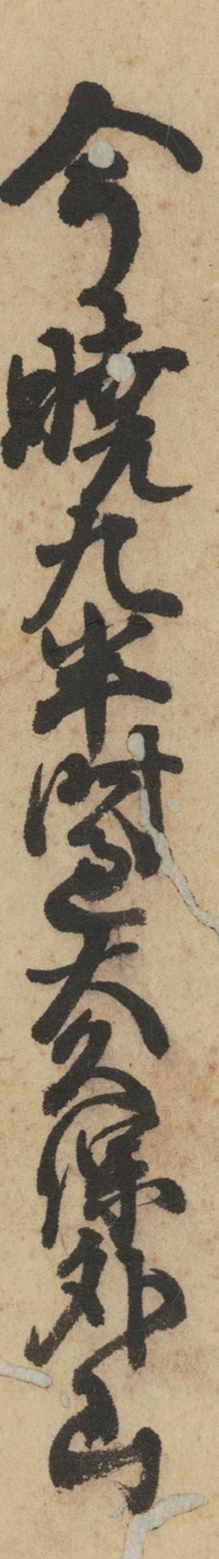今暁九半時過大久保外山
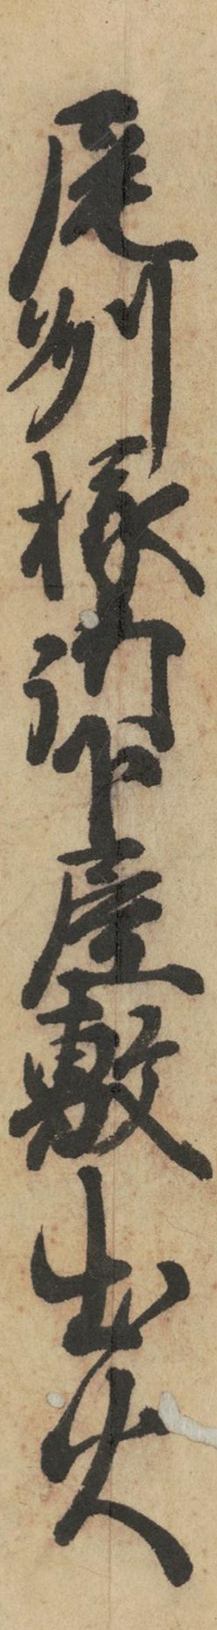尾州様御下屋敷出火
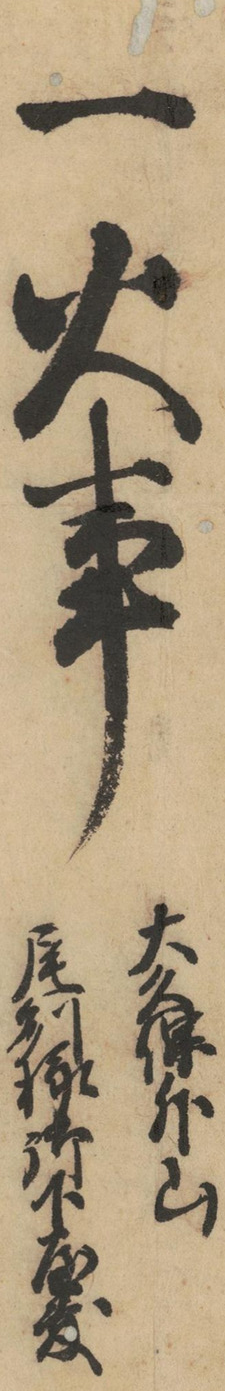一火事大久保外山
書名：[紀州藩災害記録]
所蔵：東京大学地震研究所図書室 Earthquake Research Institute Library, The University of Tokyo, JAPAN
